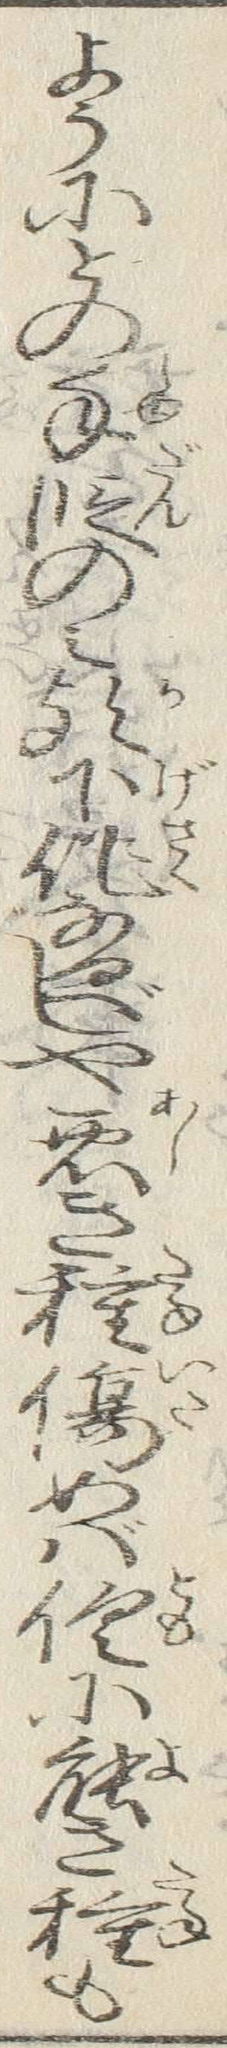ようにとの手段のみ歟下作なるべしや悪き種傷めば倶に能き種も
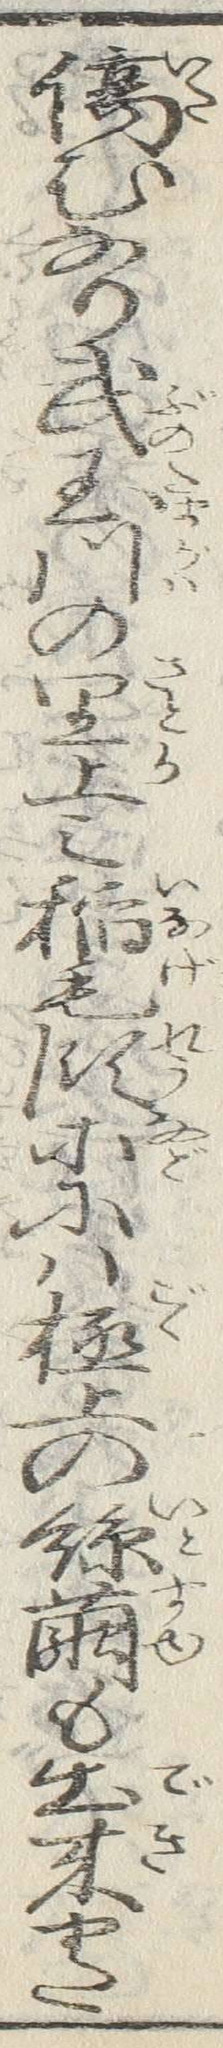傷むなり武玉川の里上み稲毛領等には極上の絲繭も出来また
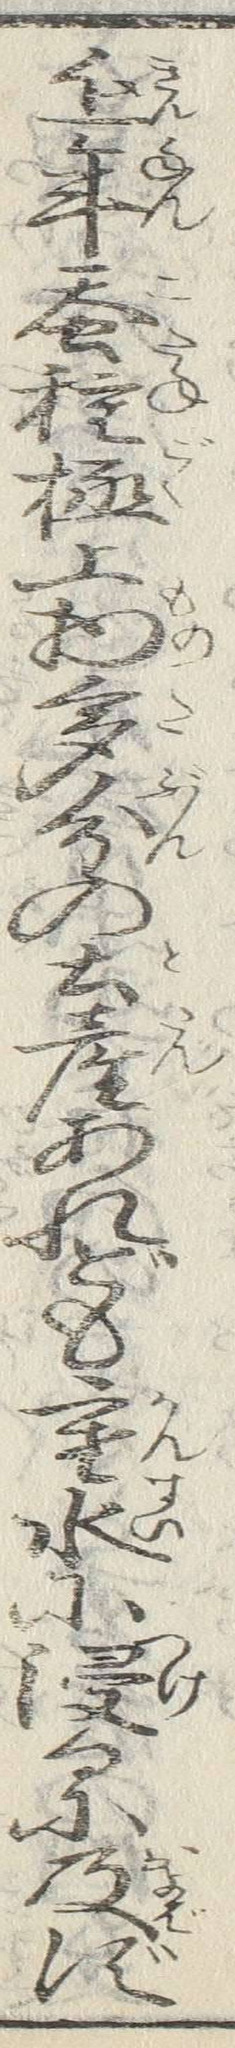近年蚕種極上物多分の土産あれども寒水に浸るに及ず
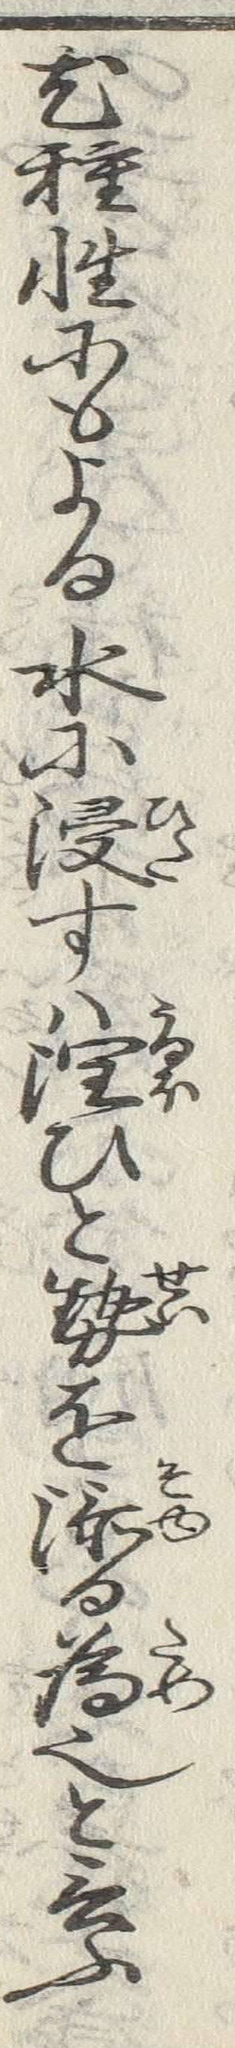尤種性にもよる水に浸すは潤ひと㔟を添る為也と云ふ
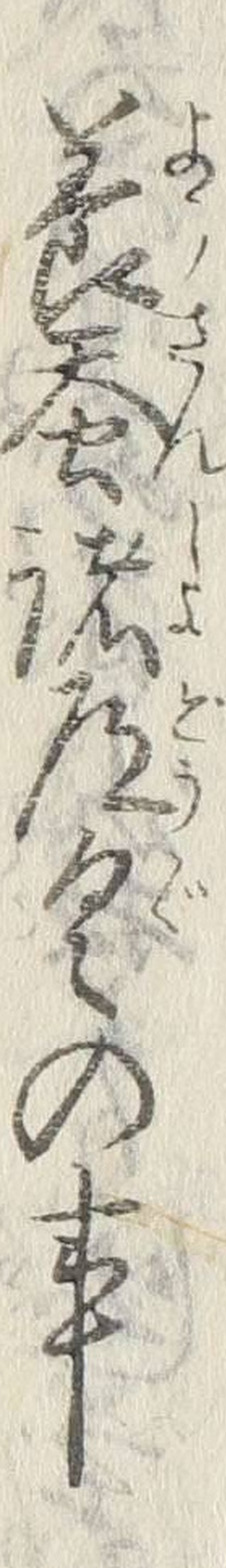養蚕諸道具の事
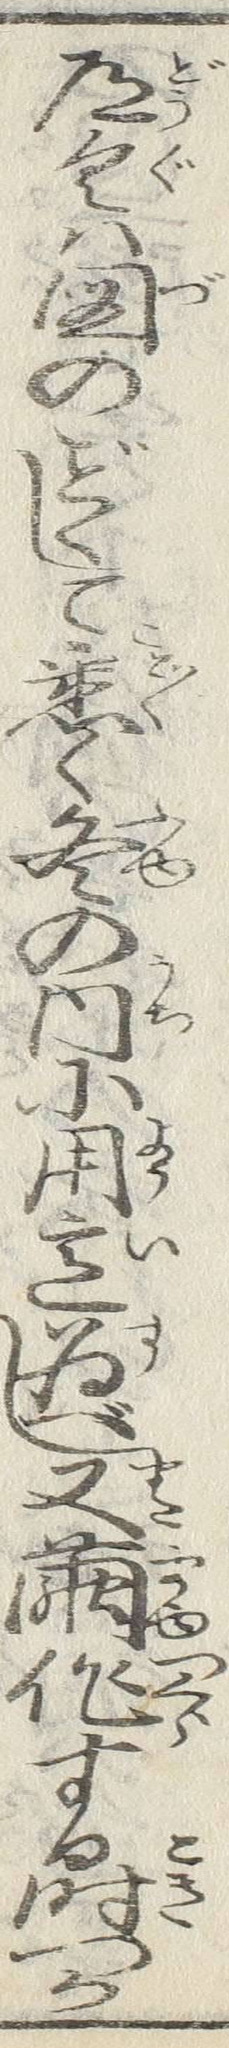道具は図のごとくして悉く冬の内に用意為べし又繭作する時つか
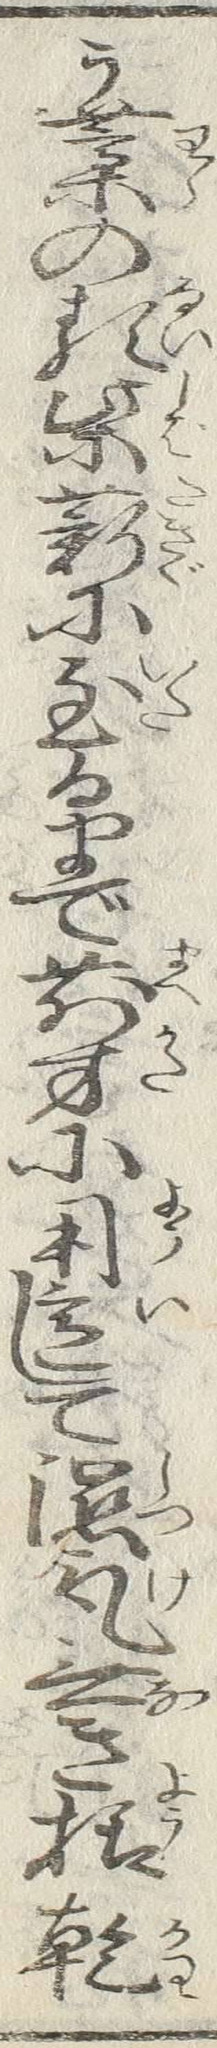う藁の類柴薪に至るまで前方に用意して濕気無き様乾
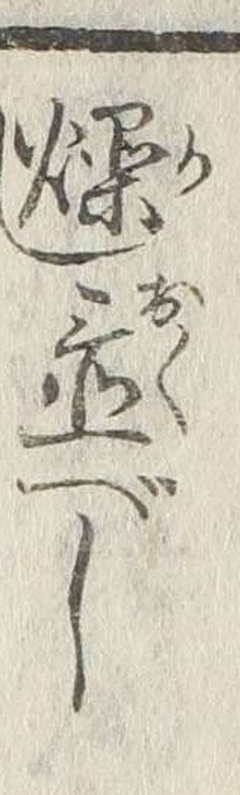燥し置べし

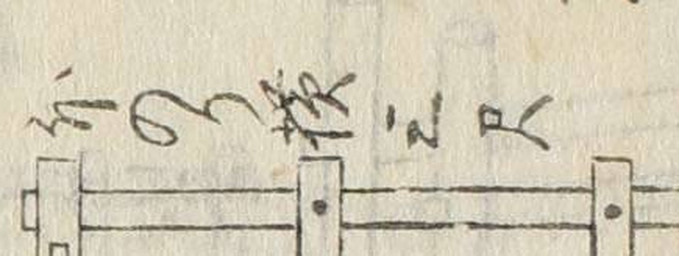外ぬり横三尺
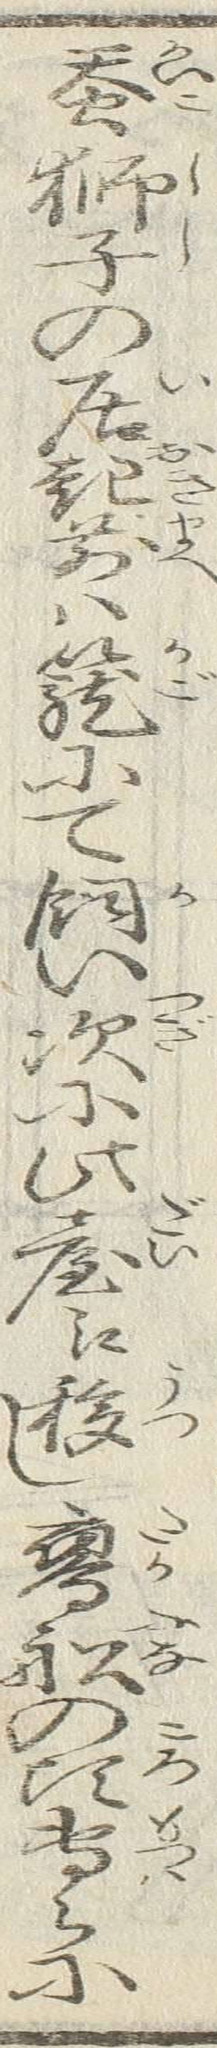蚕獅子の居起前は籠にて飼い次に此臺え移し鷹舩の頃専らに
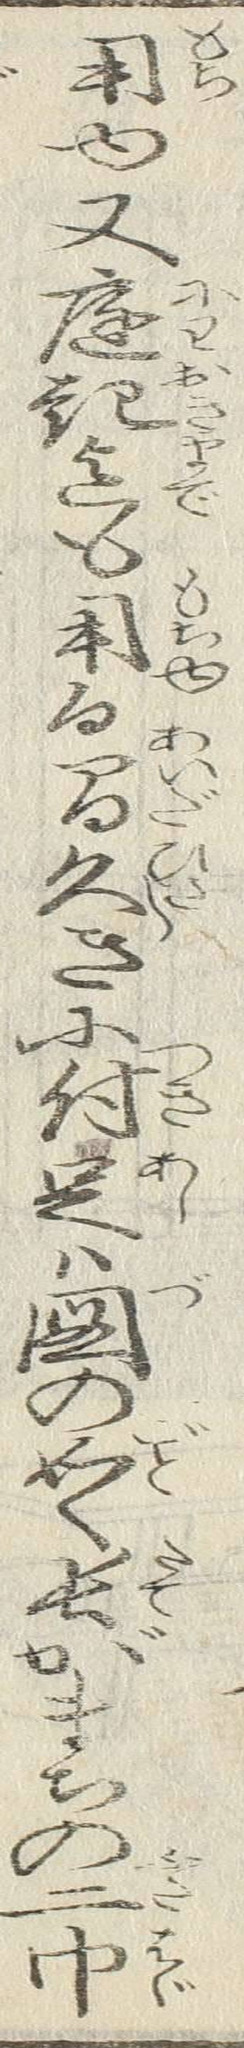用ゆ又庭起迄も用る間久きに付足は図の如く長がまちの二巾
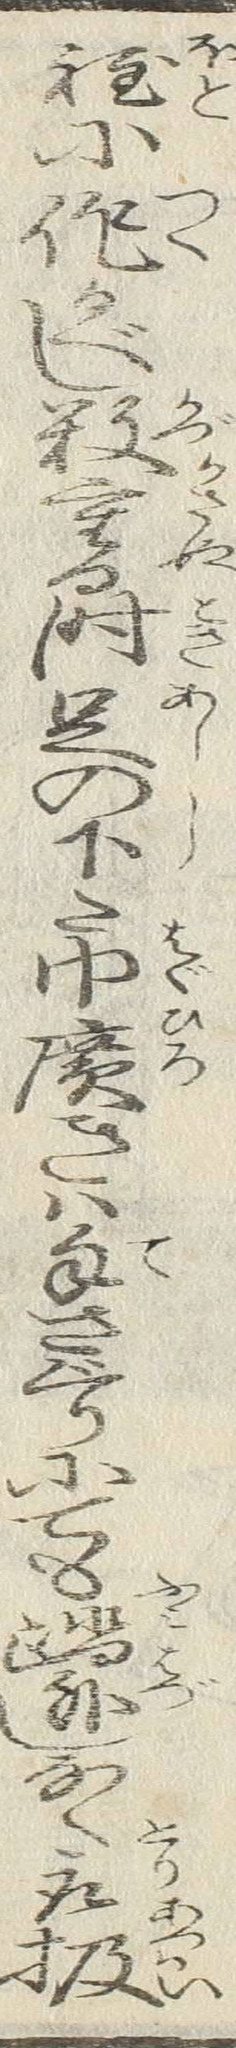程に作るべし数重る時足の下た巾廣きは手さぐりにても踏外しなく取扱
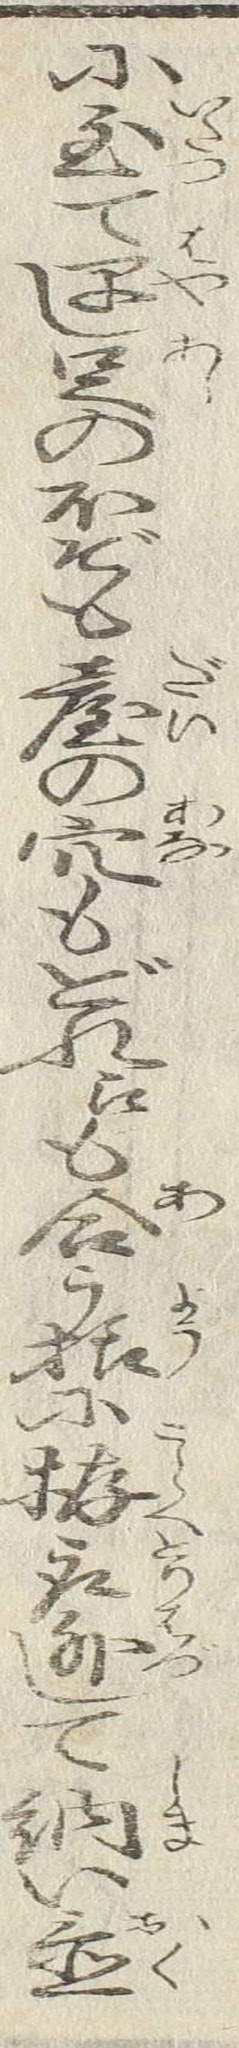に至て早し足のほぞも臺の穴もどれえも合う様に拵取外して納い置
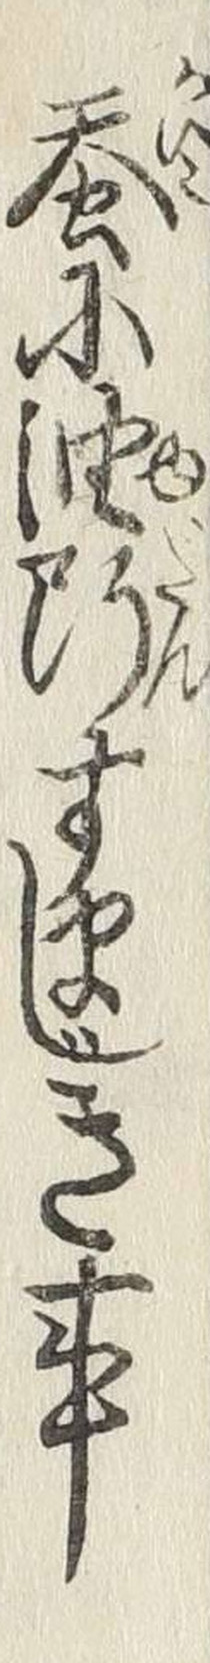蚕に油断すまじき事
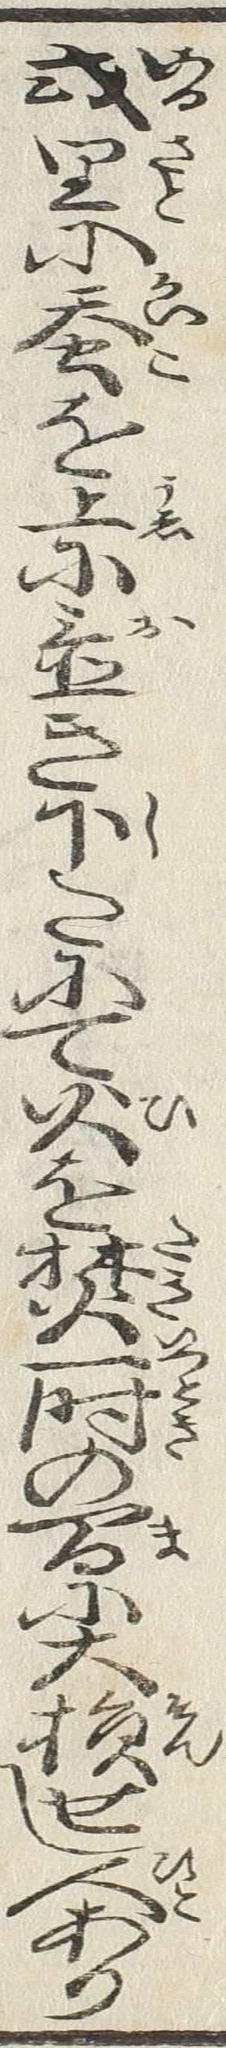或里に蚕を上に置き下たにて火を焚一时の間に大損せし人あり
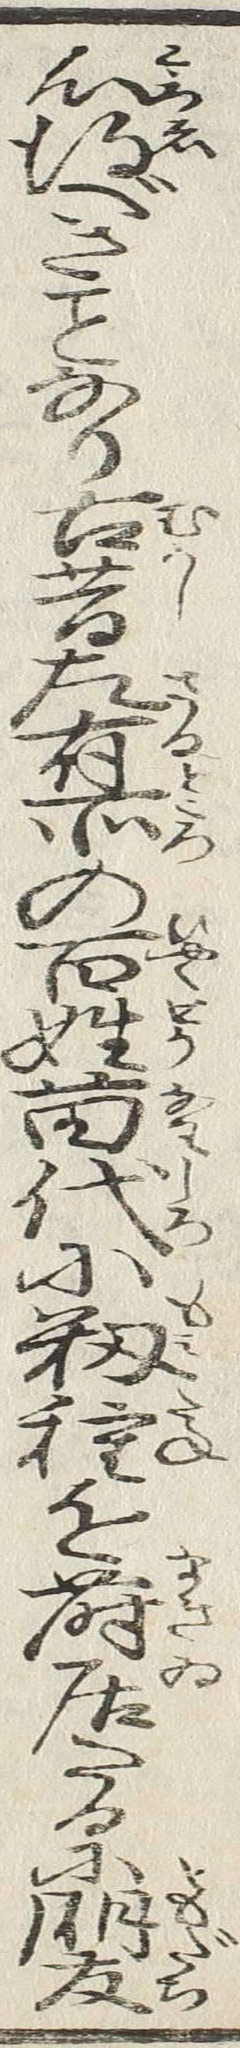心得べきことなり古昔左有所の百姓苗代に籾種を蒔居たるに朋友
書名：養蠶實驗録
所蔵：東京大学農学生命科学図書館 国文学研究資料館
